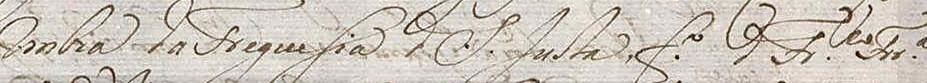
Imbra da Freguesia d .S. Justa, f.o d Fr.co Frr.a
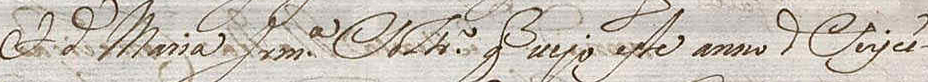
E d Maria Irm.a Soltr.o q̄ vejo este anno d Seiscē
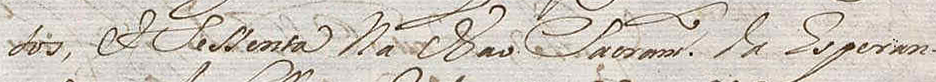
tos, E Sessenta na Nao Sacram.to da Esperan
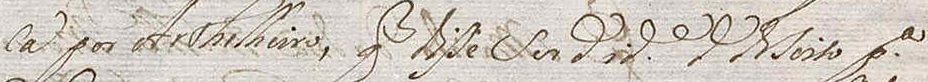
ca por Arthelheiro, q̄ disse ser d id.e desoito p.a
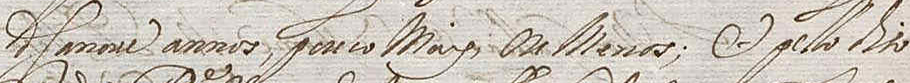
dsanoue annos, pouco Mais, ou Menos; E pello dito
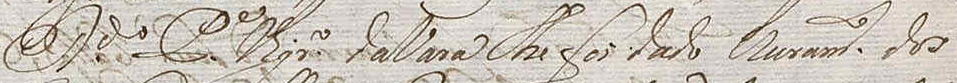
R.do P.e Vigr.o da Vara lhe foi dado Juram.to dos
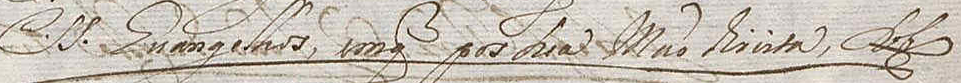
.SS. Evangelhos, em q̄ pos sua Maõ direita, Sob
